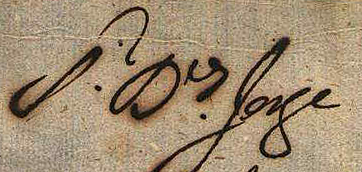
S̄. Dos. Jorge
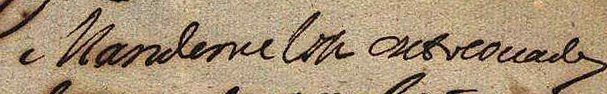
Mandeme VM outo couados
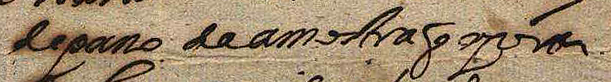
de pano da amostra q̄ o porta
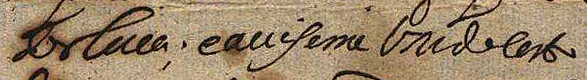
dor leua; e auiseme VM do certo
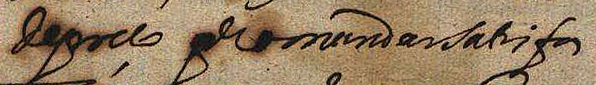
do preço pa o mandar satisfa
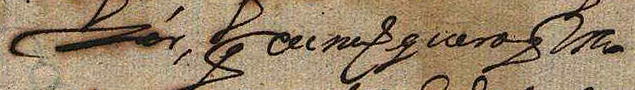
Zer, q̄ eu naõ quero q̄ VM
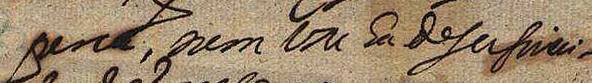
perca, nem VM ha de ser sirui
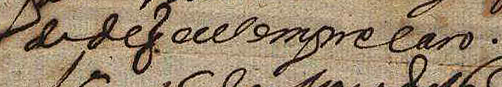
do de q̄. eu compre caro.
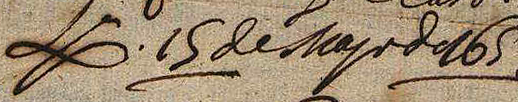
Lx. 15 de Majo de 1655
